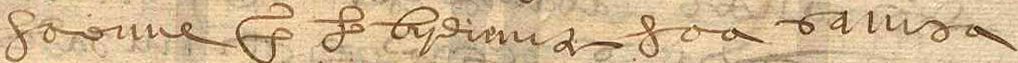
ha ouue p̄o hobydiemte haa samta
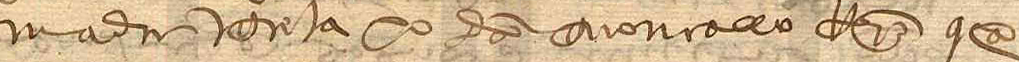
madre JgreJa e o dt̄o guoncallo Rōjz quā
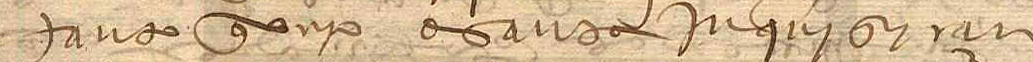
tanto q̄ veyo a santa Jnqujsyçam
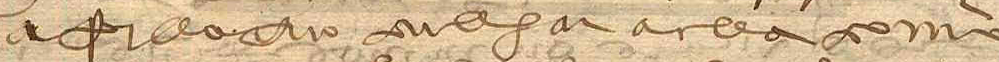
a foj lloguo cullpar a ella como
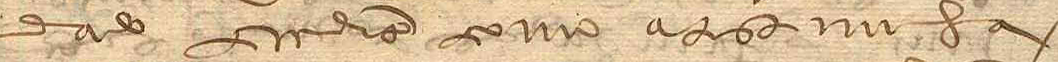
dado credito como a testemuha /
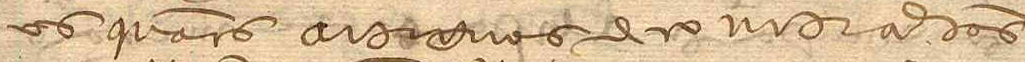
os quaes artiguos de comtradt̄as
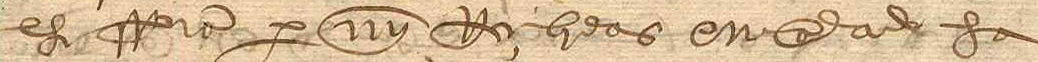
lhe fforā ꝑ m̄j Reçebjdos e mādado ha
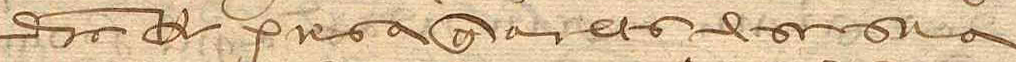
dt̄a Re presa q̄ a elles dese sua
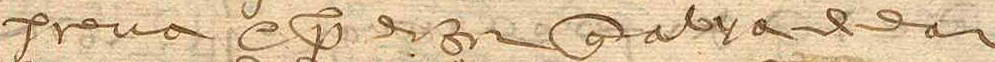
proua e p̄o dizer q̄ avya de dar
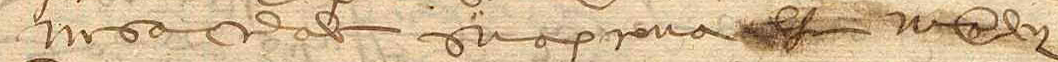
nesa cidade sua proua lhe mādey
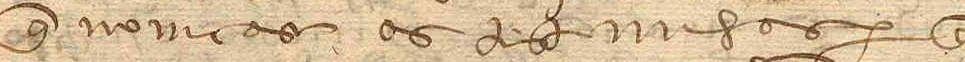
q̄ nomease as testemuhas ꝑ q̄
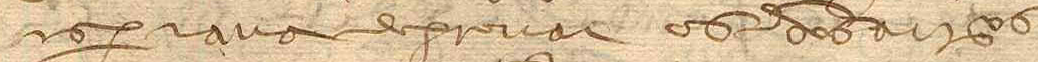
esꝑraua de prouar os dt̄os artos
